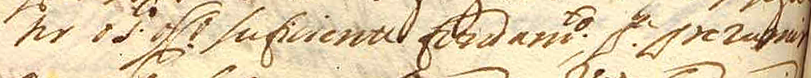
ter o S.o off.o suficiente fundamto., p.a prezumir
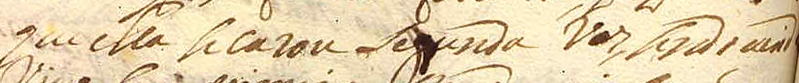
que ella se cazou segunda vez, sendo aind
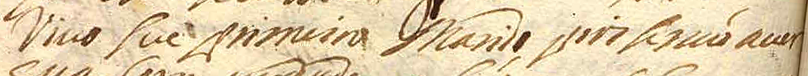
Viuo seu primeiro Marido, pois senaõ auer
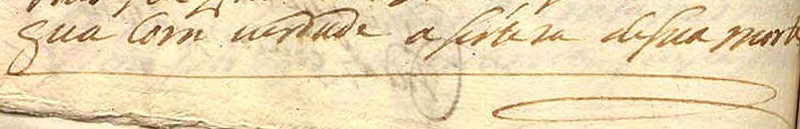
gua com uerdade a serteza de sua morte
